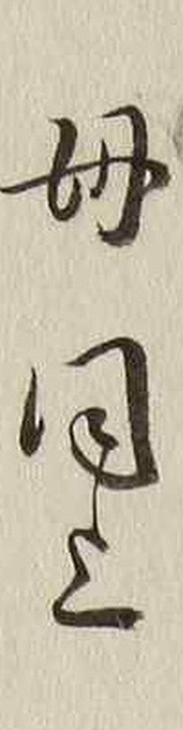母同上
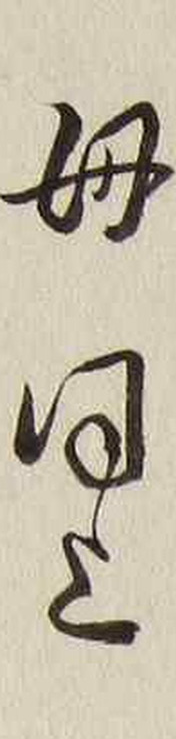母同上

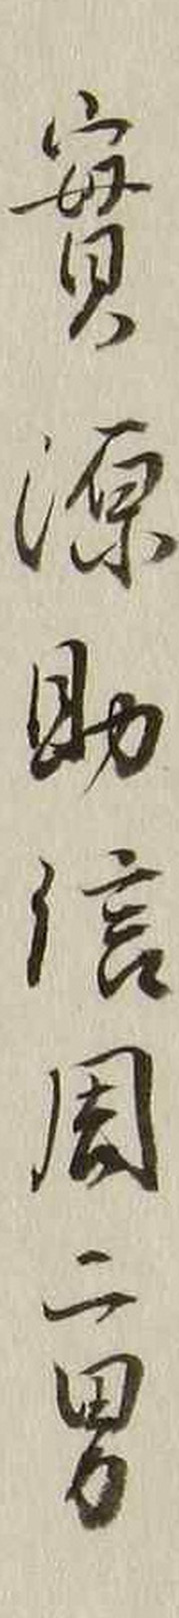実源助信周二男
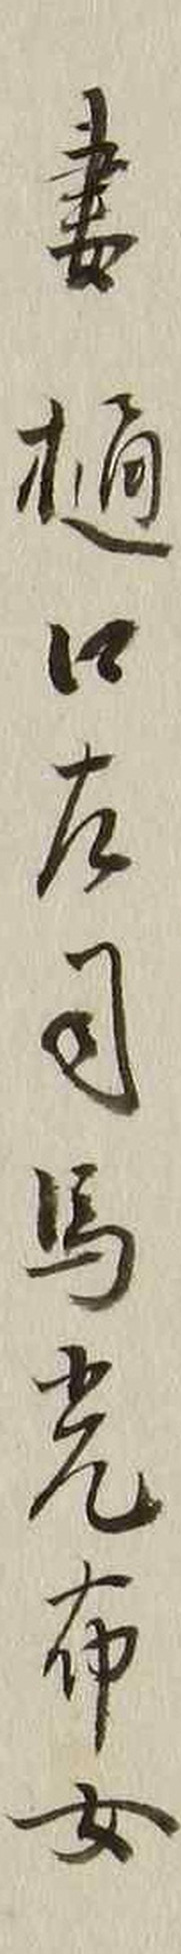妻樋口左司馬光布女
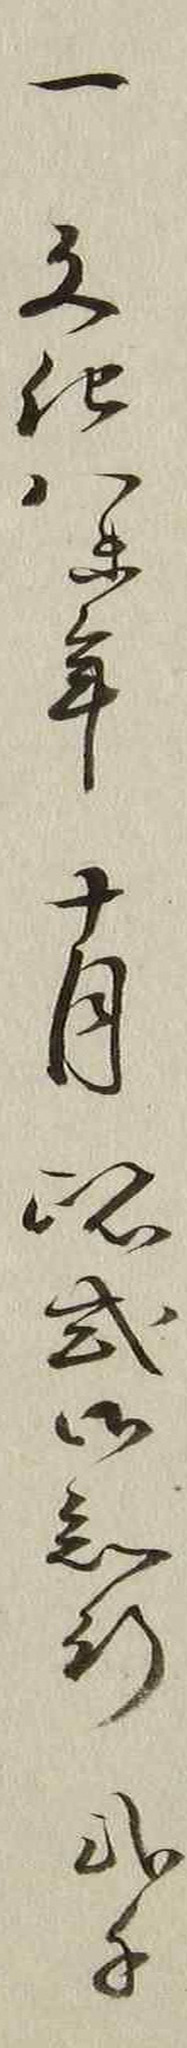一文化八未年十月跡式御知行弐千
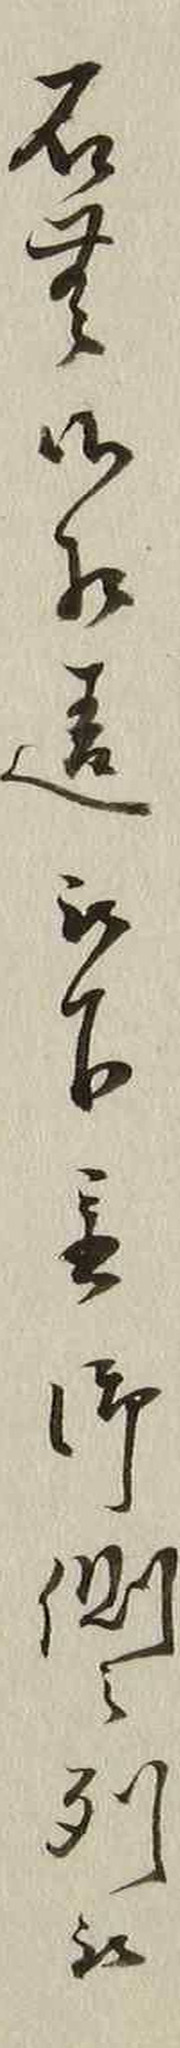石無御相違被下置御側之列被
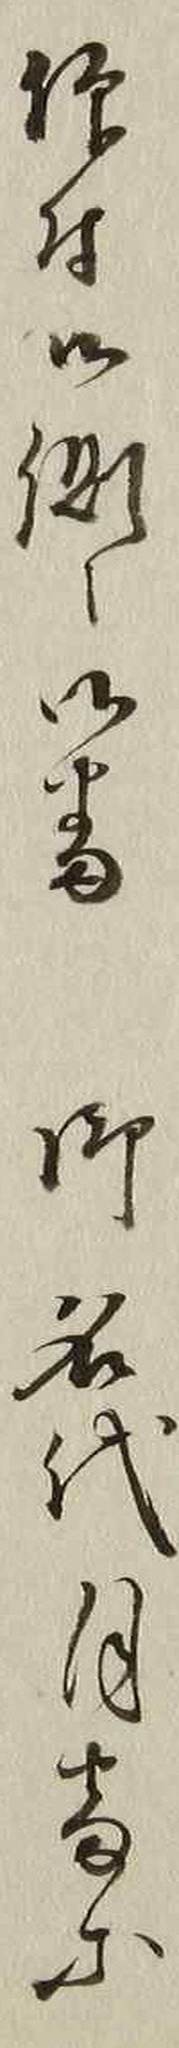仰付御側之御番御名代月番等
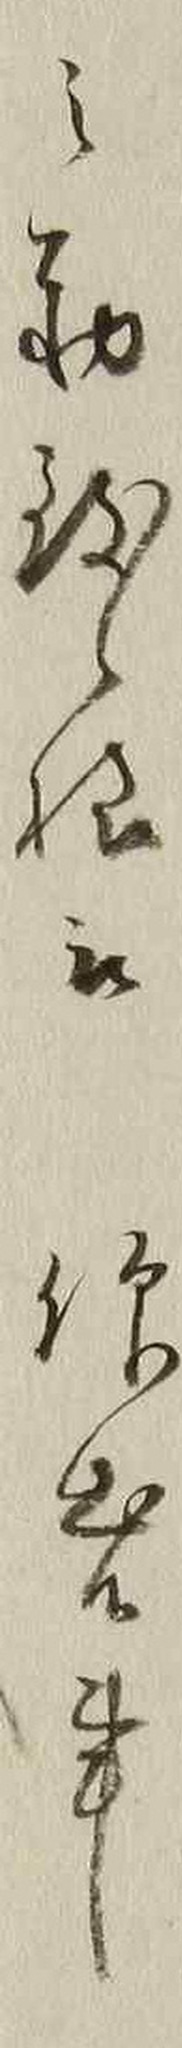之勤致候様被仰出候事
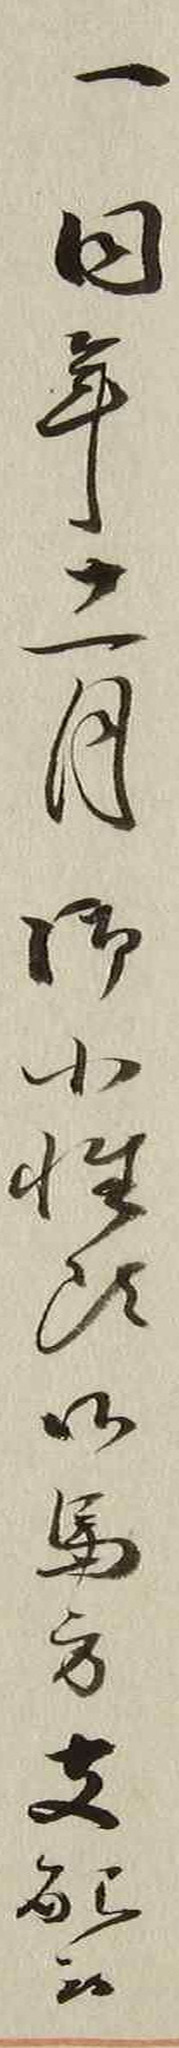一同年十一月御小姓頭御馬方支配被
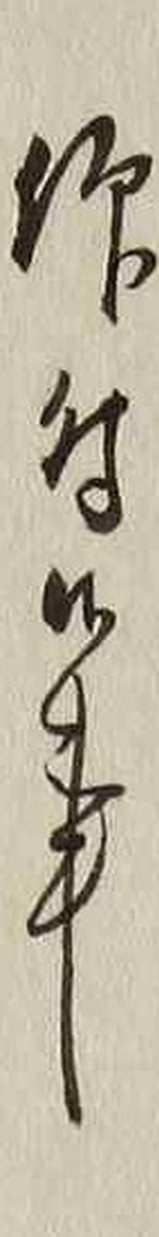仰付候事
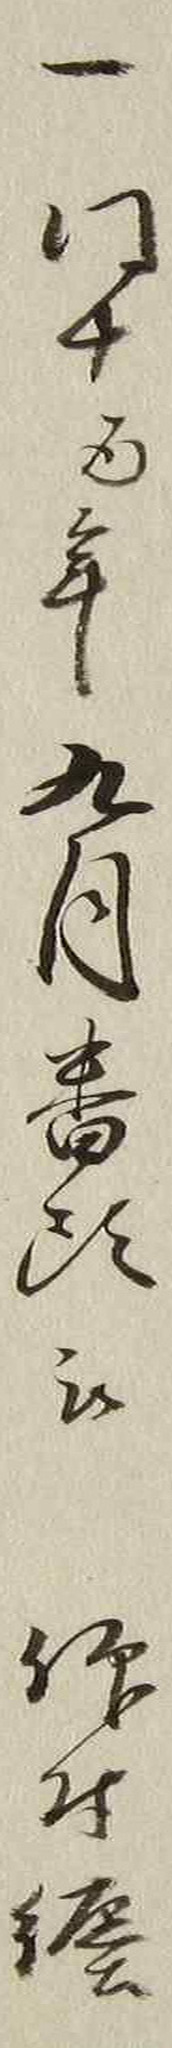一同十酉年九月番頭被仰付纏
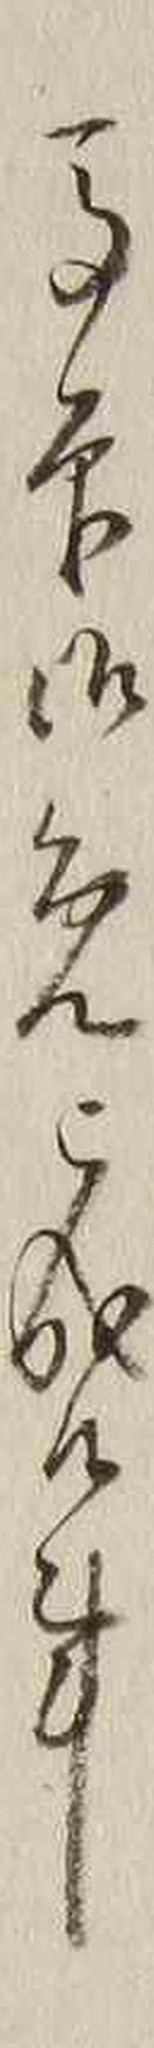馬印御め免被成候事
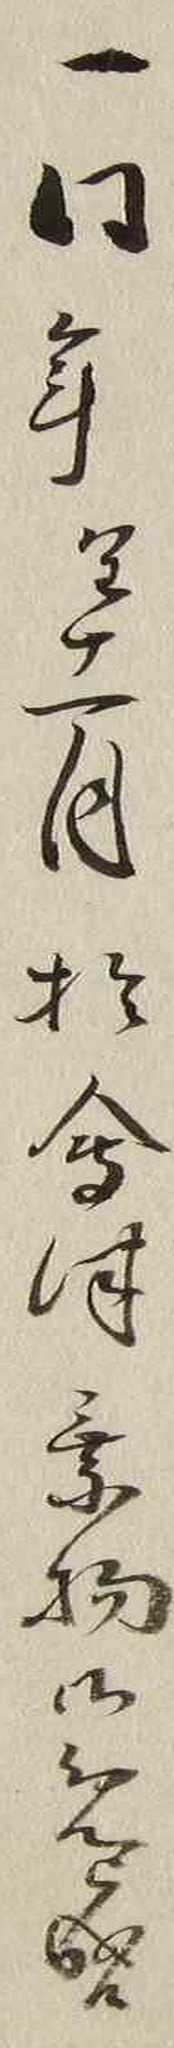一同年閏十一月於会津乗物御免被成候
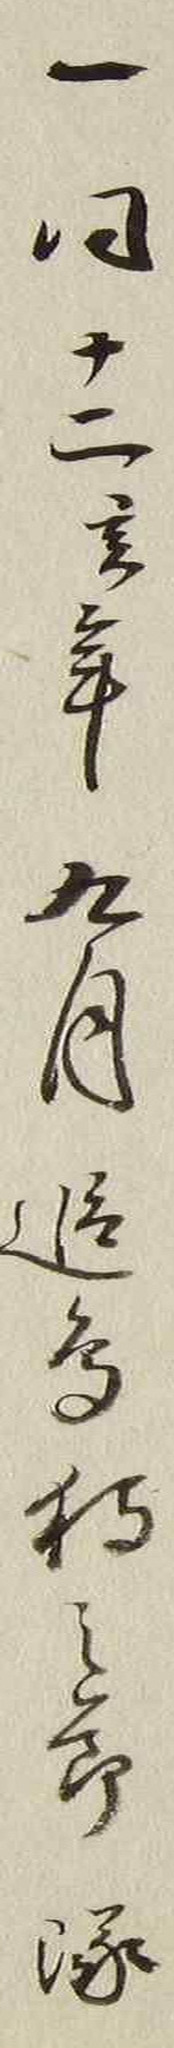一同十二亥年九月追鳥狩之節隊
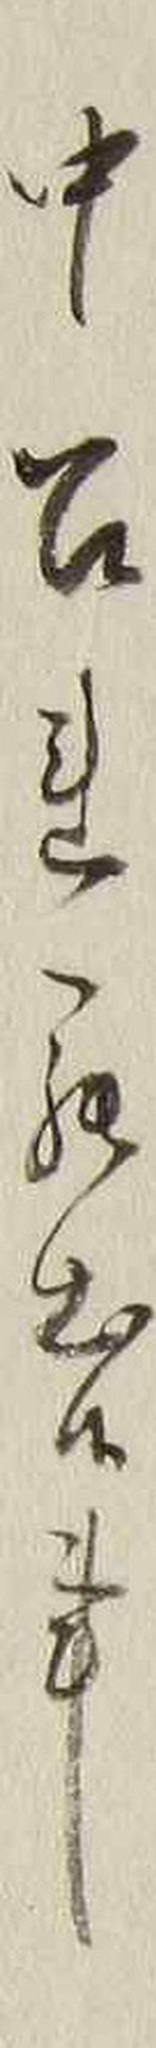中召蓮罷出候事
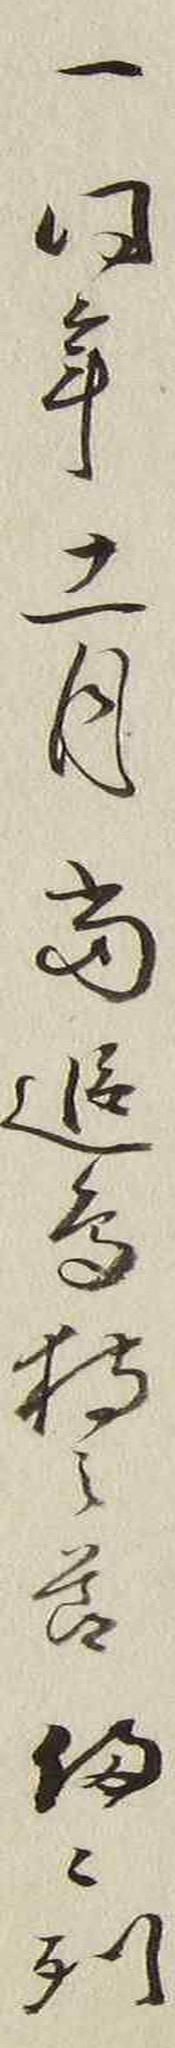一同年十一月当追鳥狩之節備々列
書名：諸士系譜　巻之159　な之部1
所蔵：会津若松市立会津図書館
